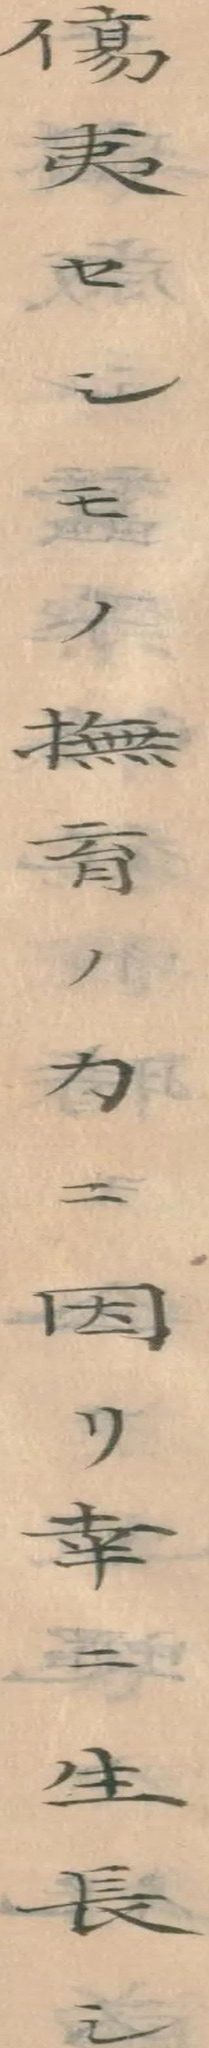傷夷セシモノ撫育ノ力ニ因リ幸ニ生長シ
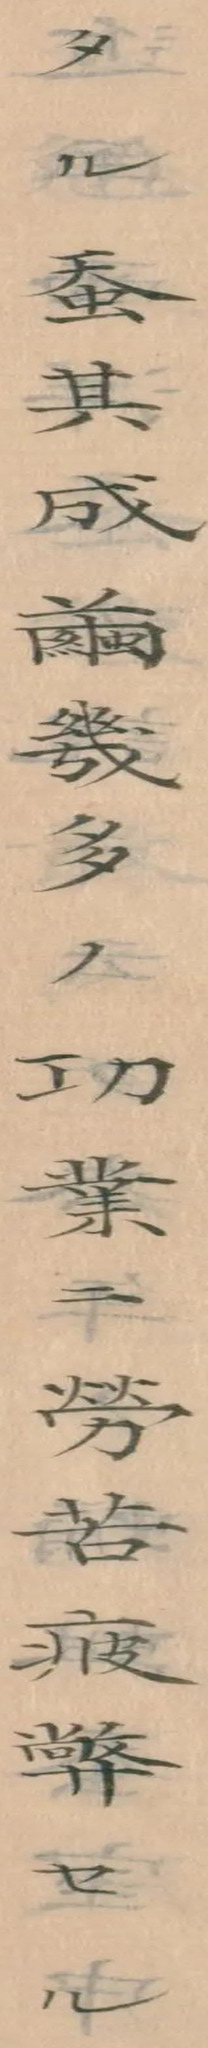タル蚕其成繭幾多ノ功業ニ労苦疲弊セル
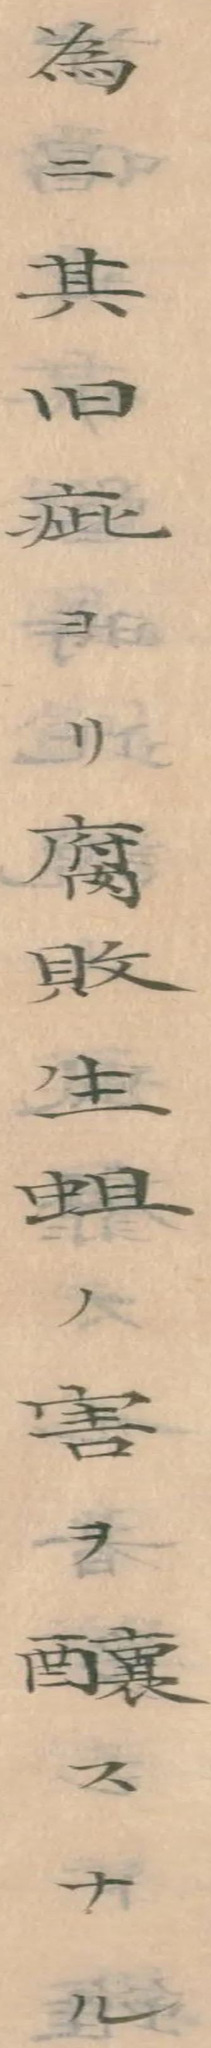為ニ其旧疵ヨリ腐敗生蛆ノ害ヲ醸スナル
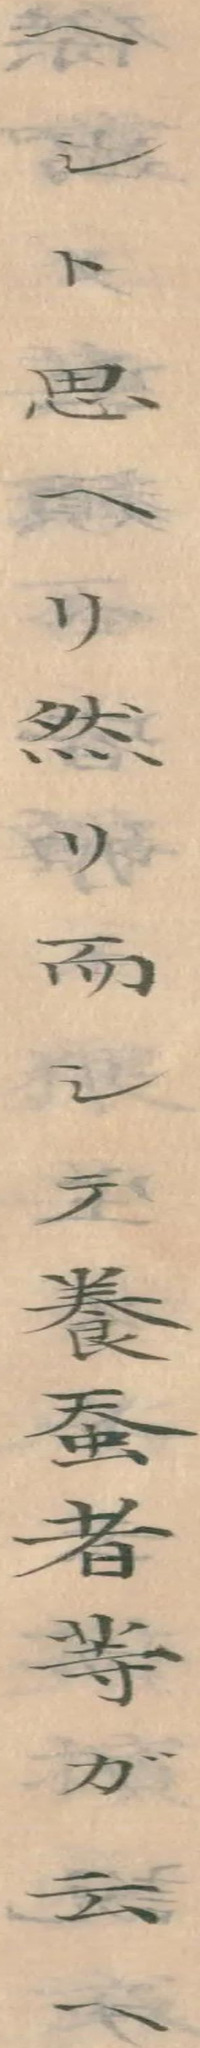ヘシト思ヘリ然リ而シテ養蚕者等ガ云ヘ
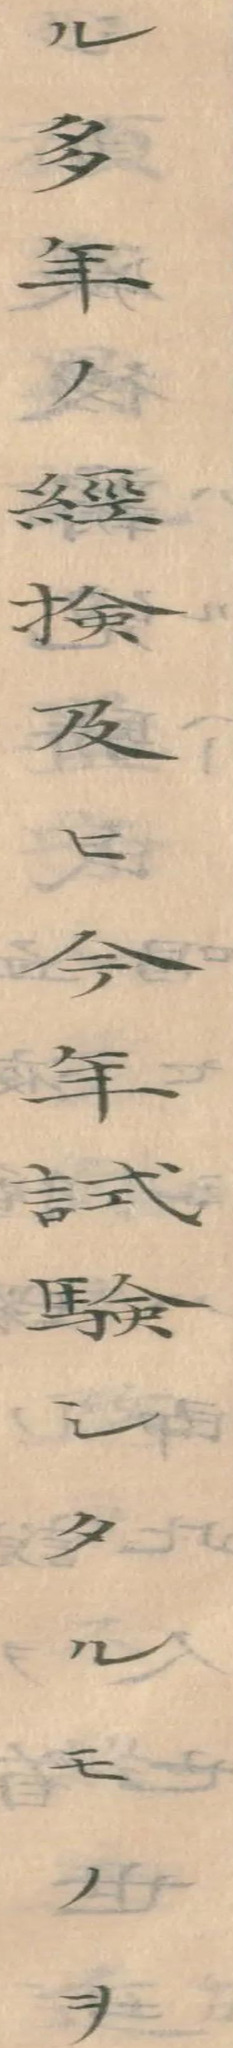ル多年ノ経検及ヒ今年試験シタルモノヲ
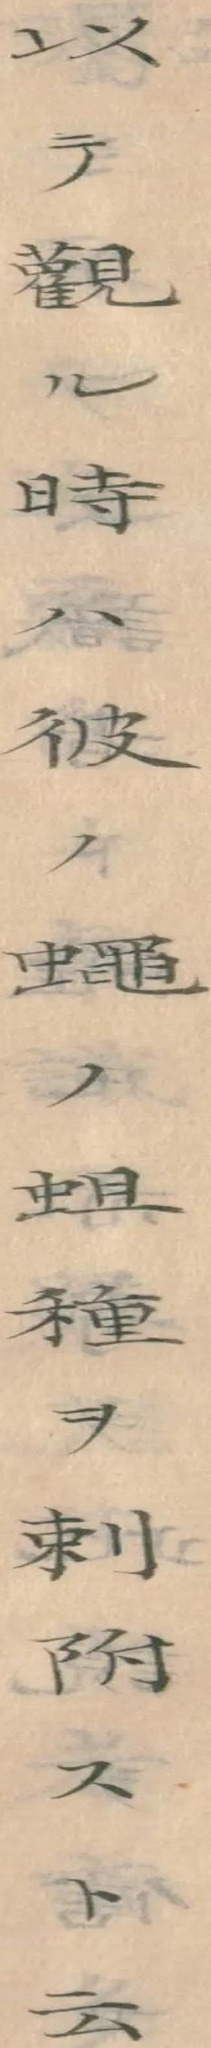以テ観ル時ハ彼ノ蝿ノ蛆種ヲ刺附スト云
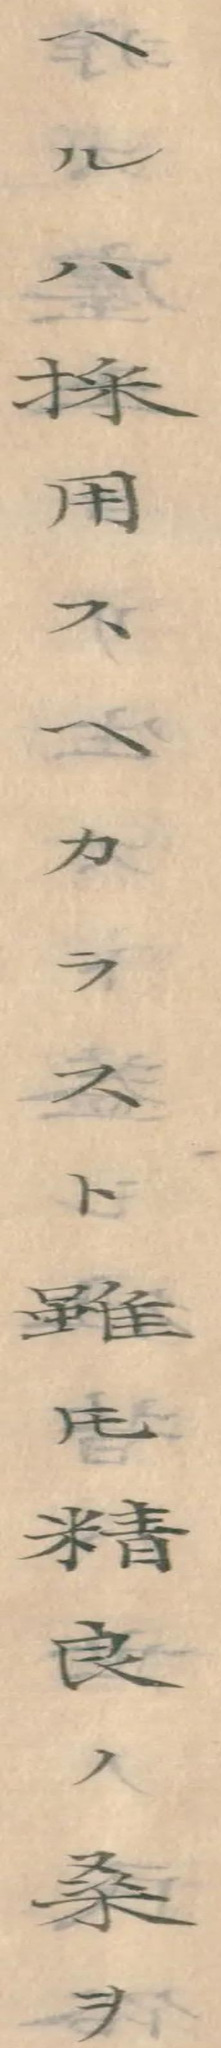ヘルハ採用スヘカラスト雖トモ精良ノ桑ヲ
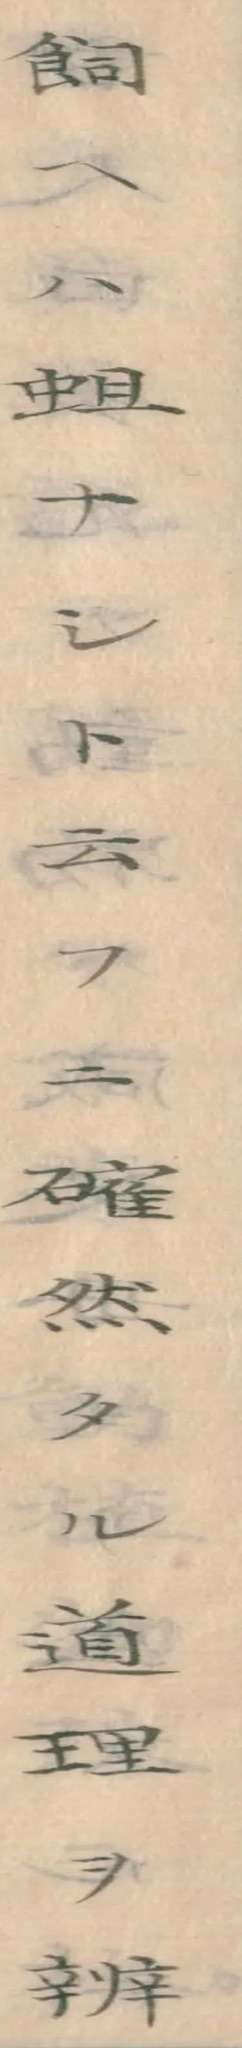飼ヘハ蛆ナシト云フニ確然タル道理ヲ弁
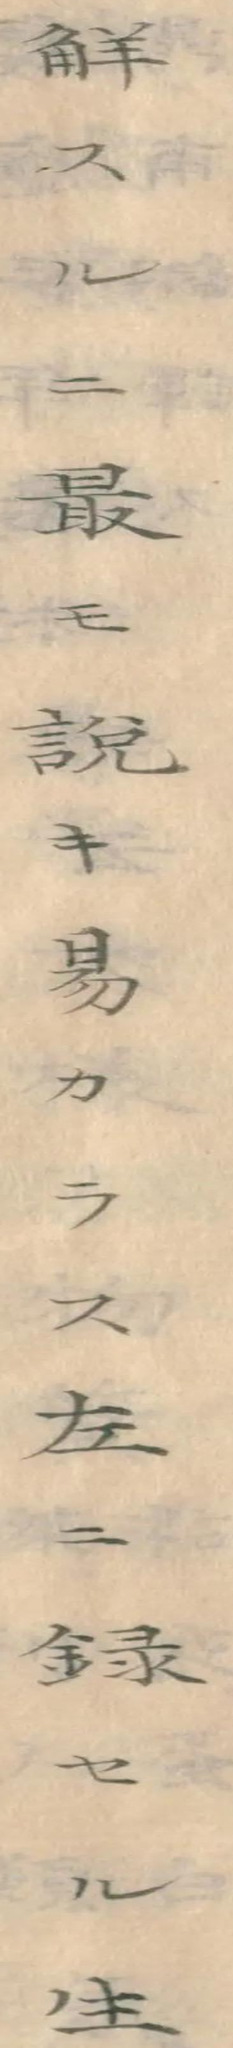解スルニ最モ説キ易カラス左ニ録セル生
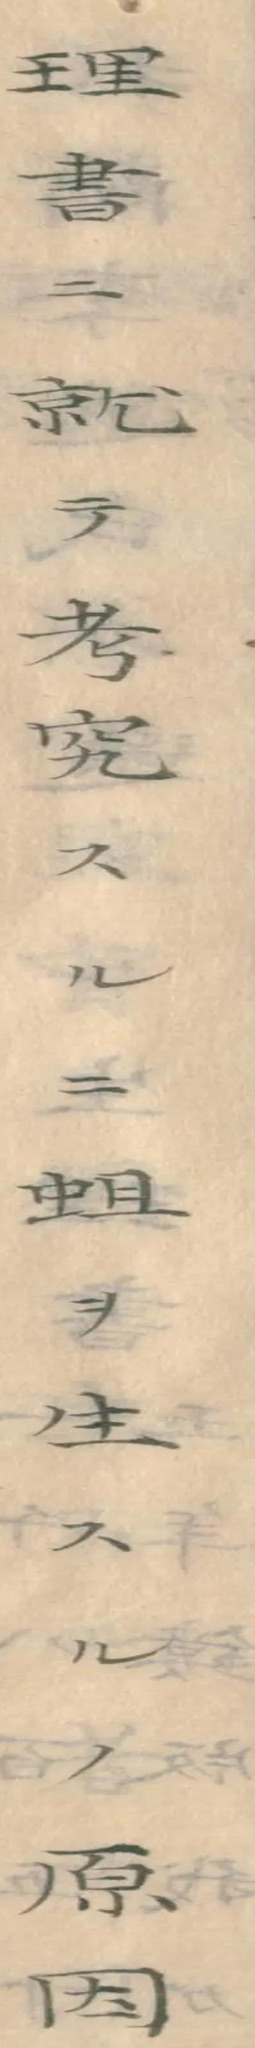理書ニ就テ考究スルニ蛆ヲ生スルノ原因
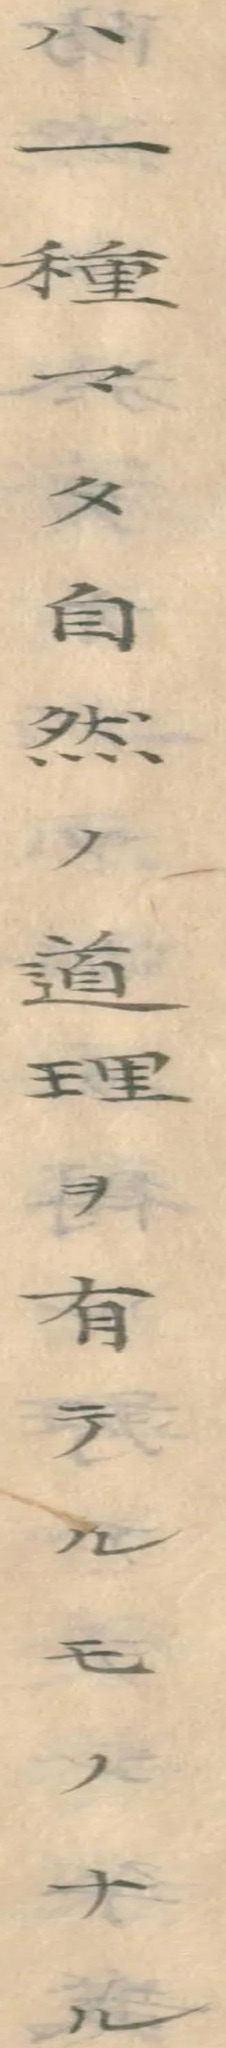ハ一種マタ自然ノ道理ヲ有テルモノナル
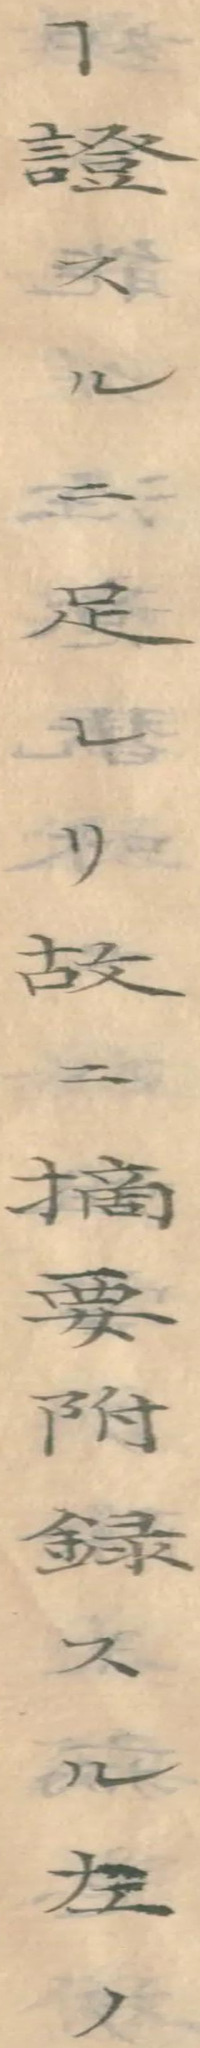コト証スルニ足レリ故ニ摘要附録スル左ノ

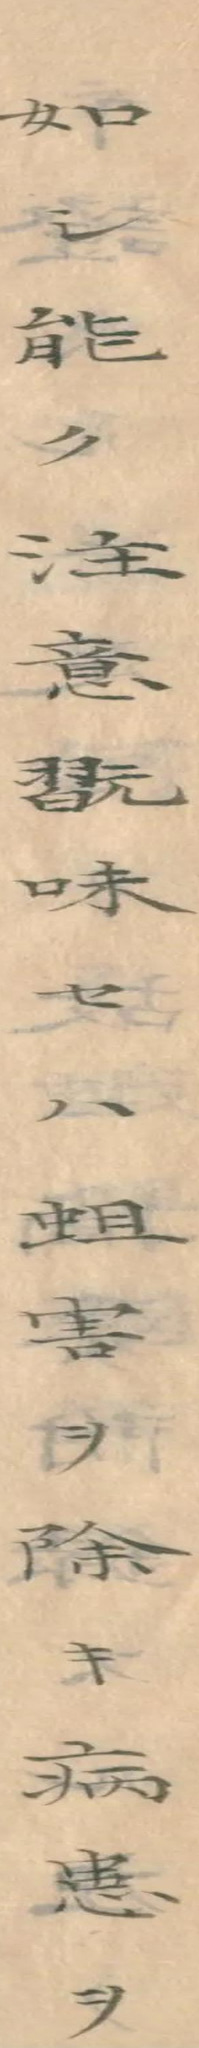如シ能ク注意翫味セハ蛆害ヲ除キ病患ヲ
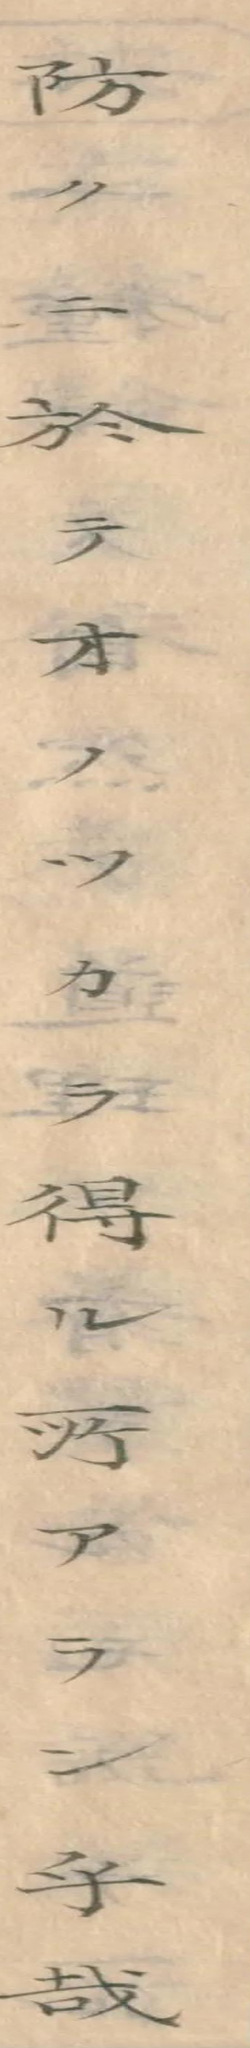防クニ於テオノツカラ得ル所アラン乎哉
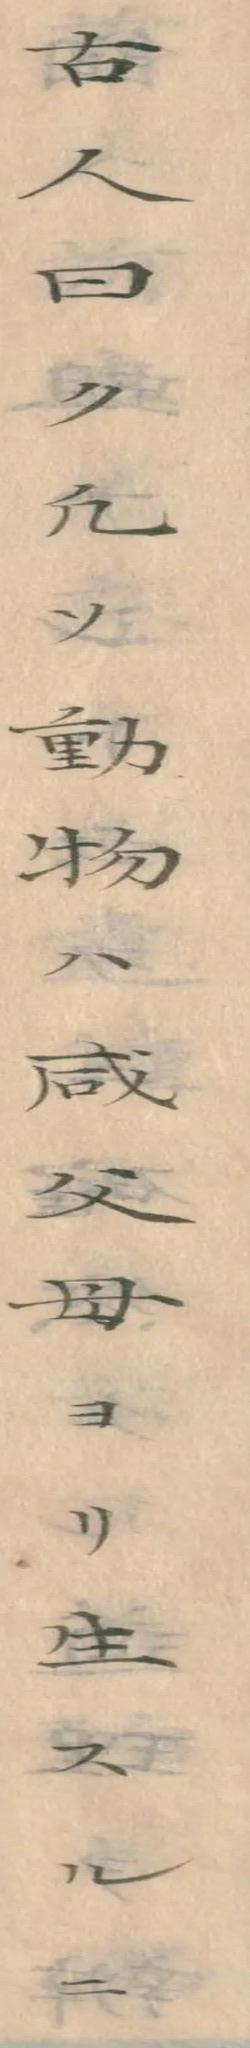古人曰ク凡ソ動物ハ咸父母ヨリ生スルニ
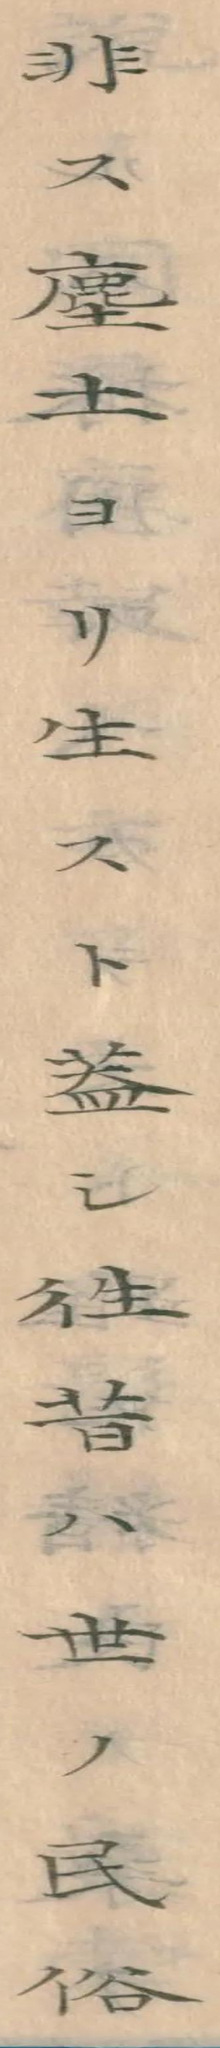非ス塵土ヨリ生スト蓋シ往昔ハ世ノ民俗
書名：蚕桑集成
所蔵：国立国会図書館 National Diet Library, JAPAN
